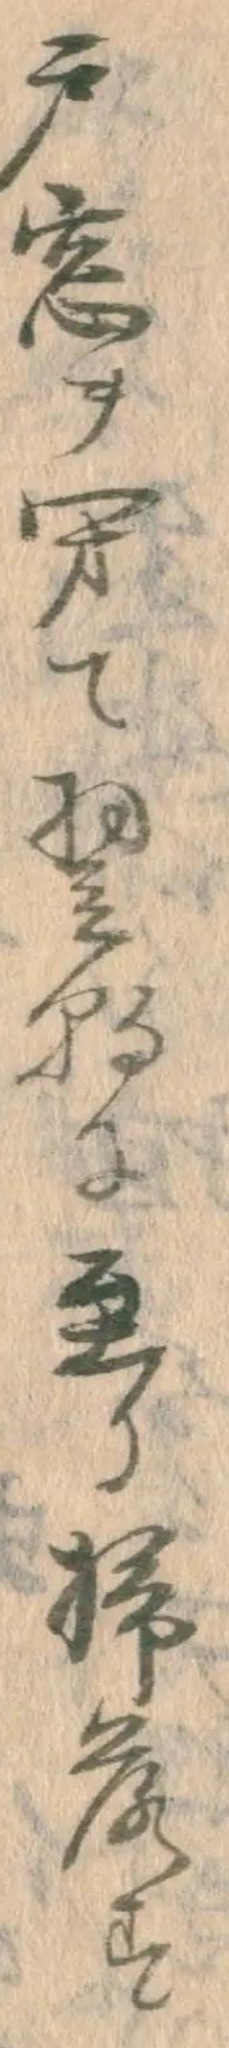戸窓を閉て翌朝に至り掃落す
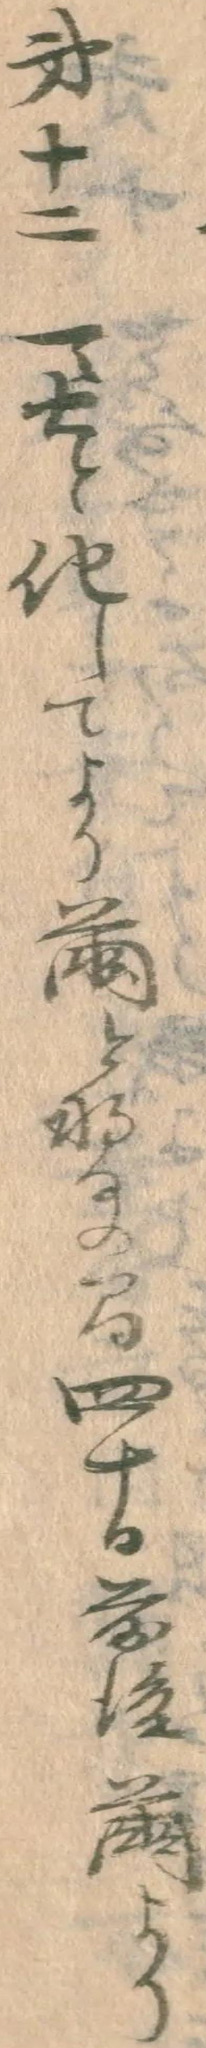第十二蚕と化してより繭となるの間四十日前後繭より
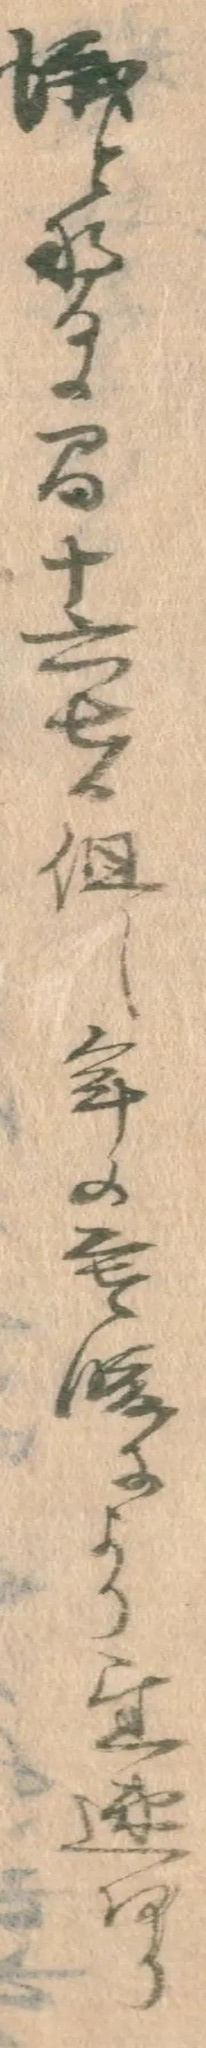蟻となるの間十六七日但し年の寒暖により遅速あり
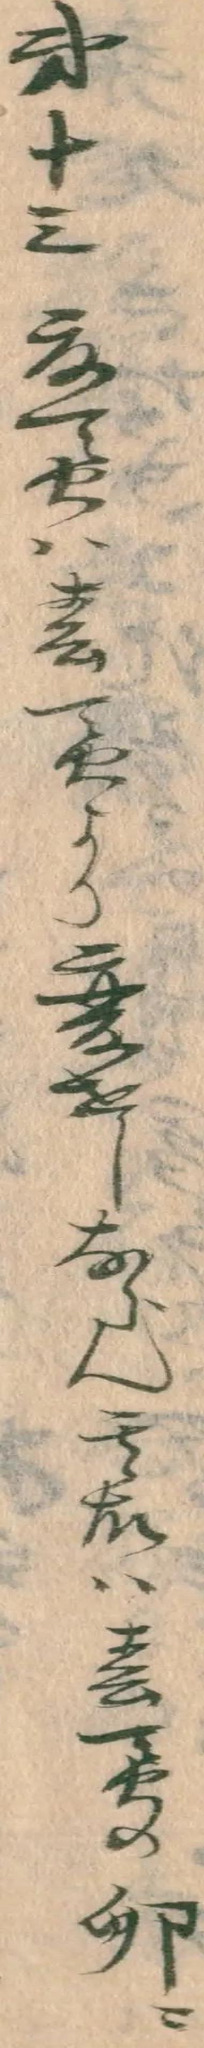第十三夏蚕ハ春蚕より変せしならん其故ハ春蚕の卵ニ
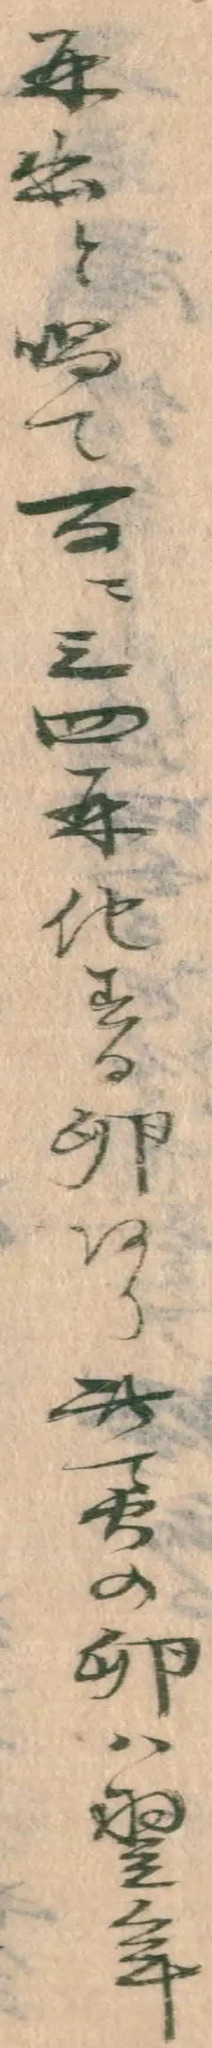再出と唱て百に三四再化する卵あり此蚕の卵は翌年
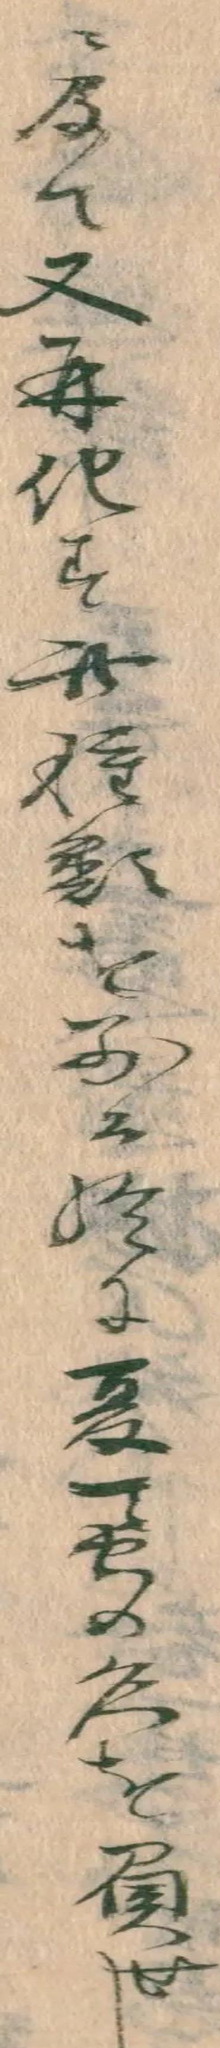ニ及て又再化す此種類を別而終に夏蚕の名を負せし
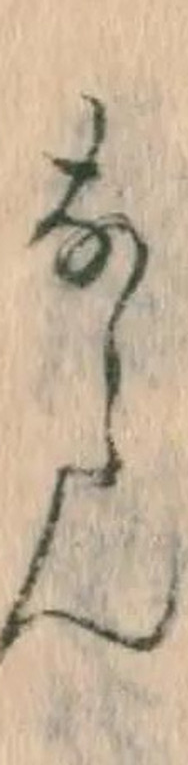ならん
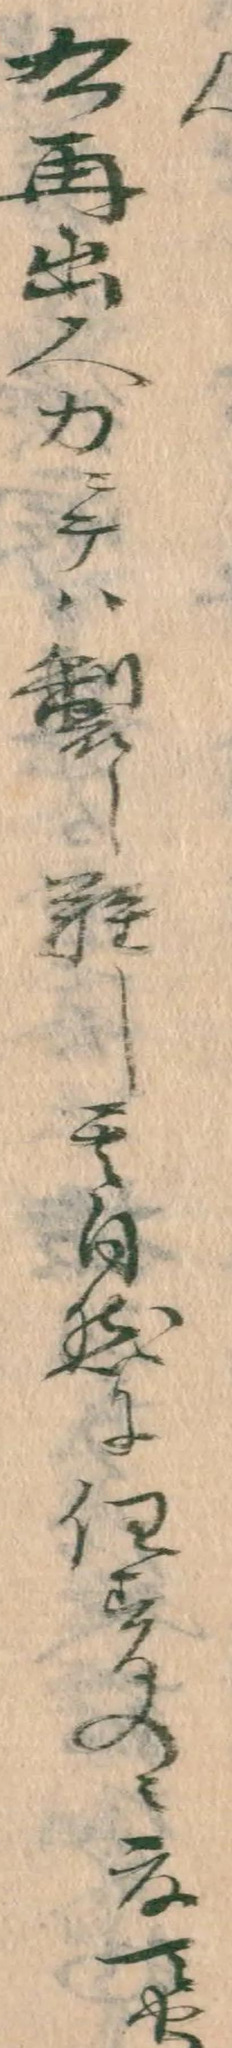右再出人力ニテハ製し難し其自然に任するのミ夏蚕
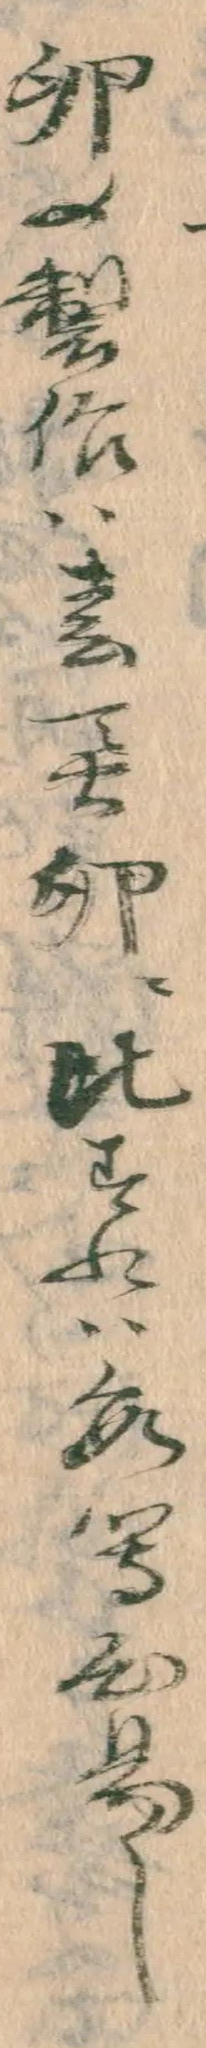卵の製作は春蚕卵ニ比すれは数等心易し
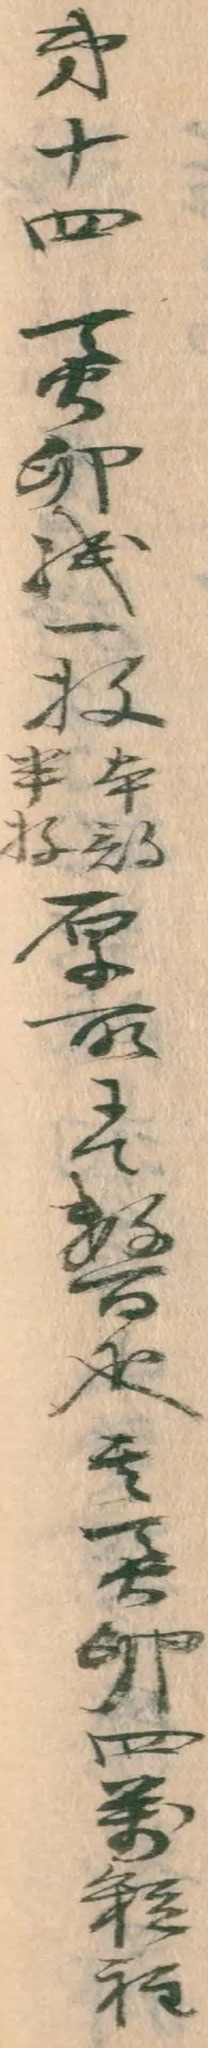第十四蚕卵紙一枚本部半枚厚取にて数百疋其蚕卵四万粒程
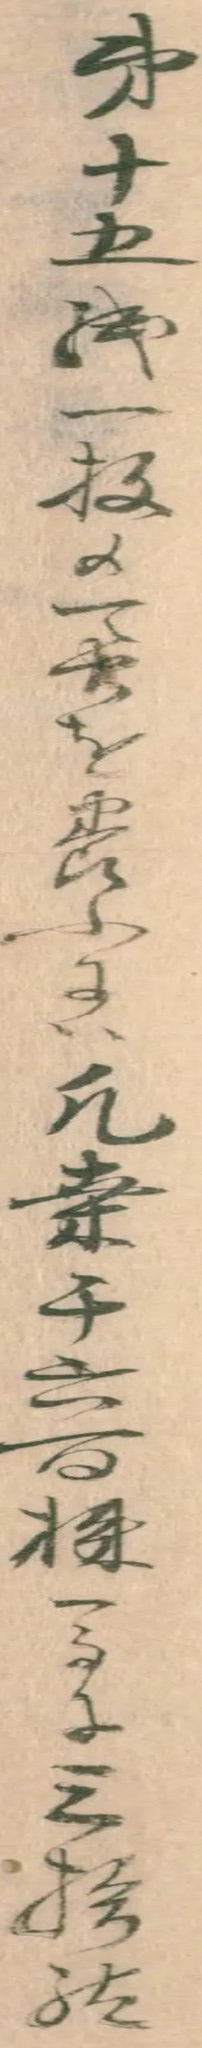第十五紙一枚の蚕を養ふにハ凡桑千六百株馬に三拾駄
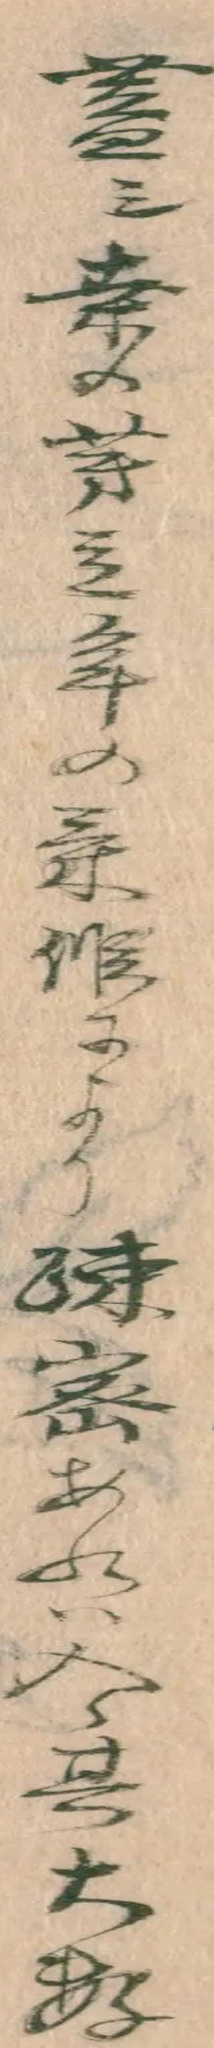蓋シ常の芽立年の気候により疎密あれハ今其大数
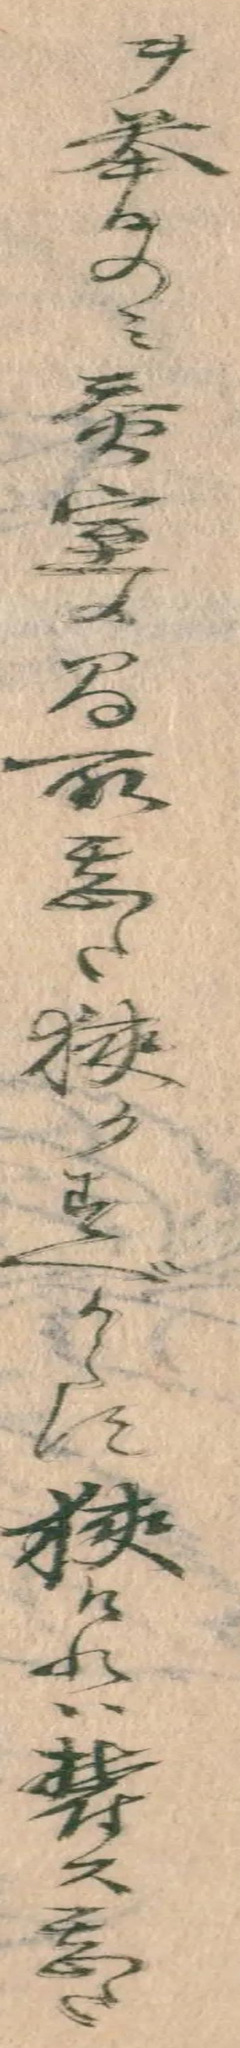ヲ挙るのミ蚕室の間取甚た狭クすべからす狭けれハ欝ス甚タ
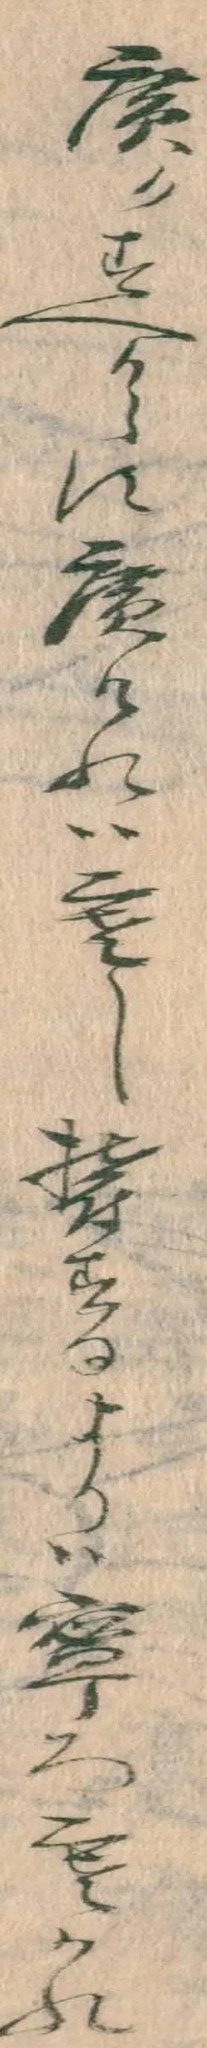広クすへからす広けれは寒し欝するよりハ寧ろ寒かれ
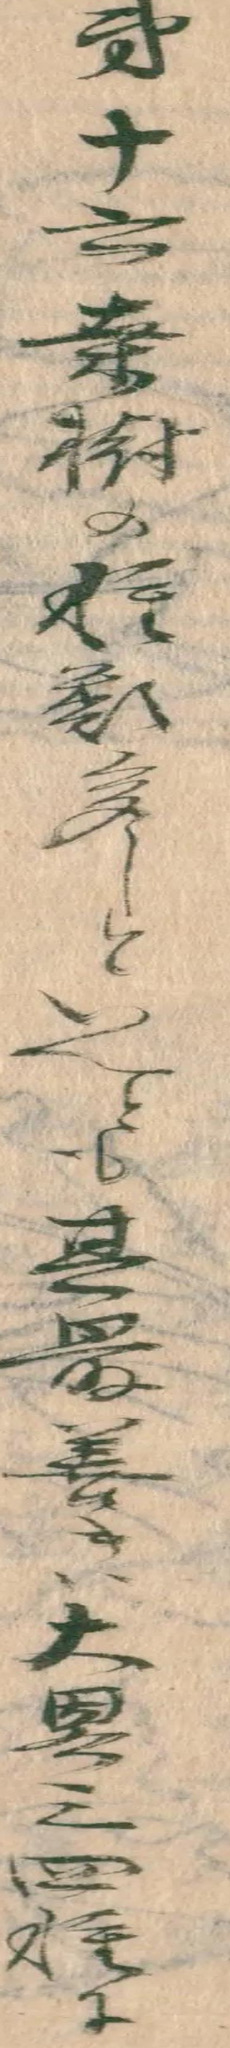第十六桑樹の種類多しといへとも其最善キハ大略三四種に
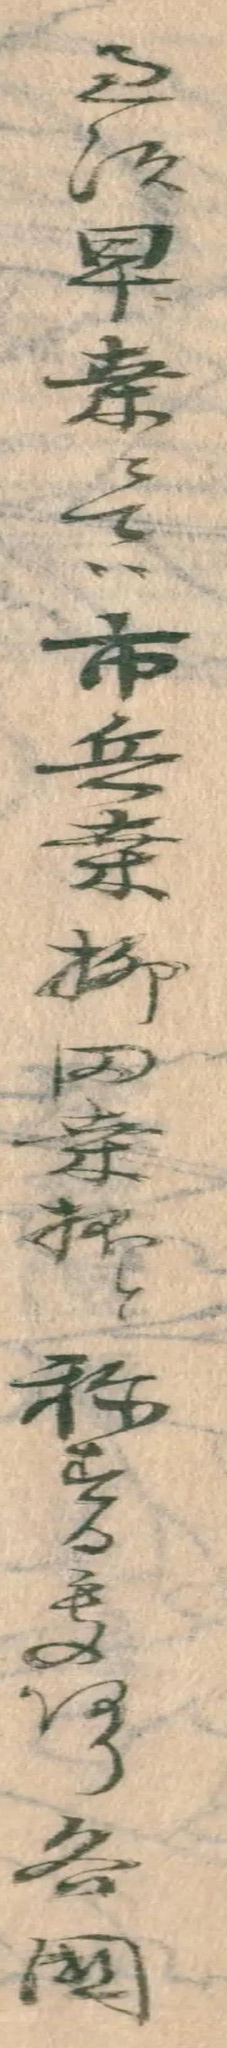過す早桑ニては市兵桑柳田桑抔と称するものあり各国
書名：蚕桑集成
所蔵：国立国会図書館 National Diet Library, JAPAN
